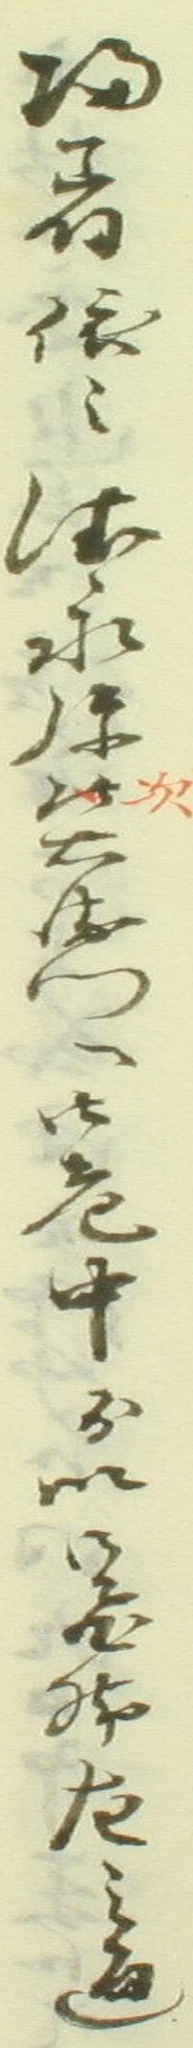帰着依之徳永弥次右衛門へ御老中ゟ御飛脚左之通
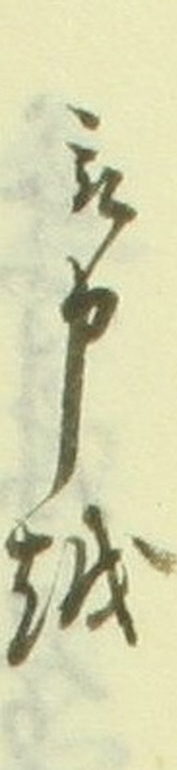被申越
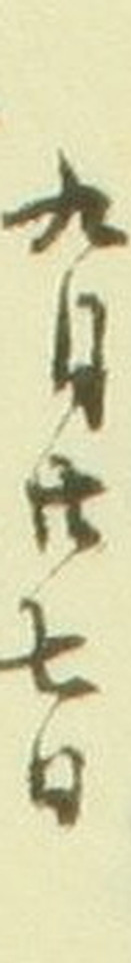九月廿七日
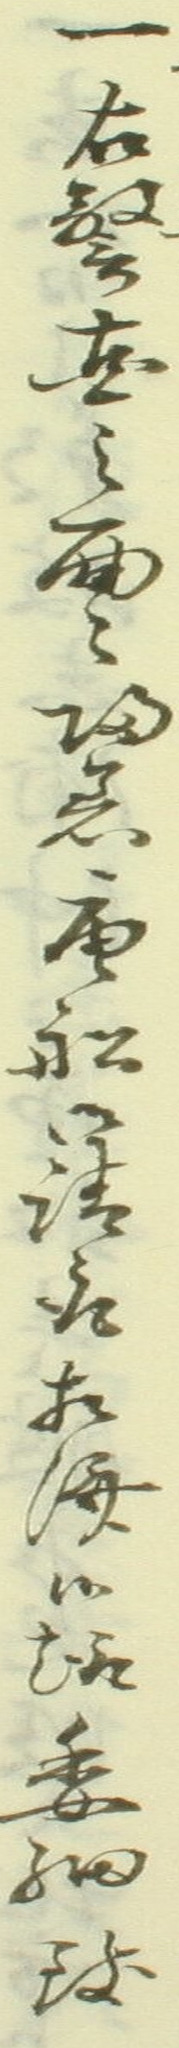一右警固之面々帰着唐船御請取相済候趣委細致
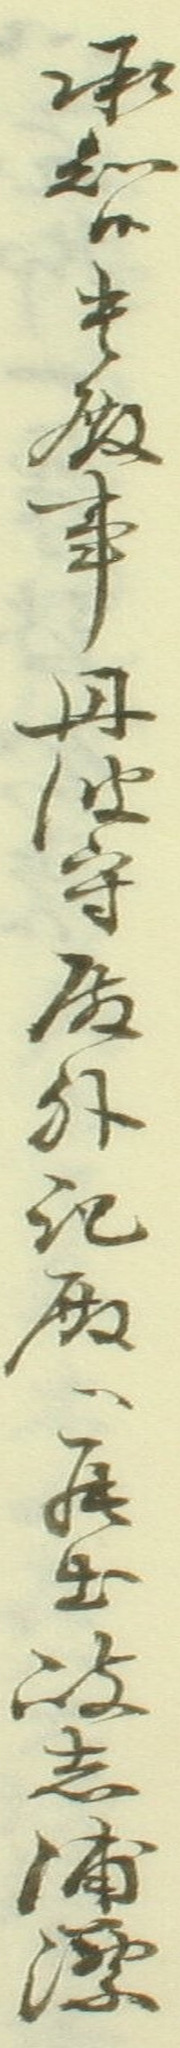承知候貴殿事丹波守殿外記殿へ罷出岐志浦漂
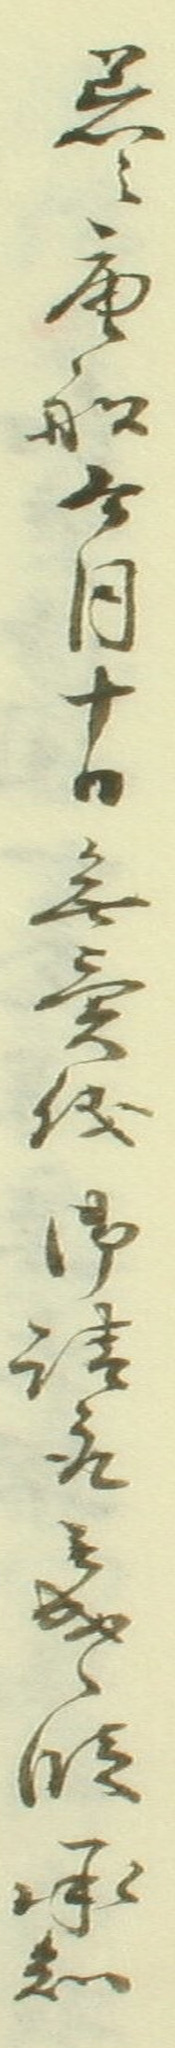着之唐船今月十日無異議御請取被成候段承知
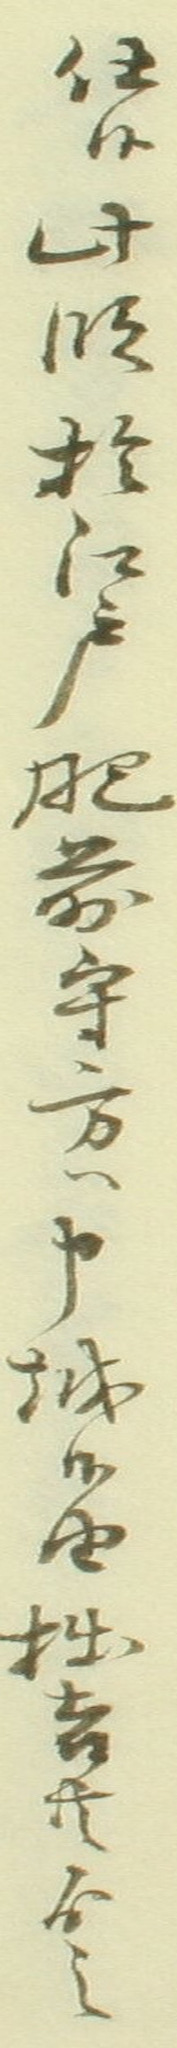仕候此段於江戸肥前守方へ申越候由拙者共ゟ之
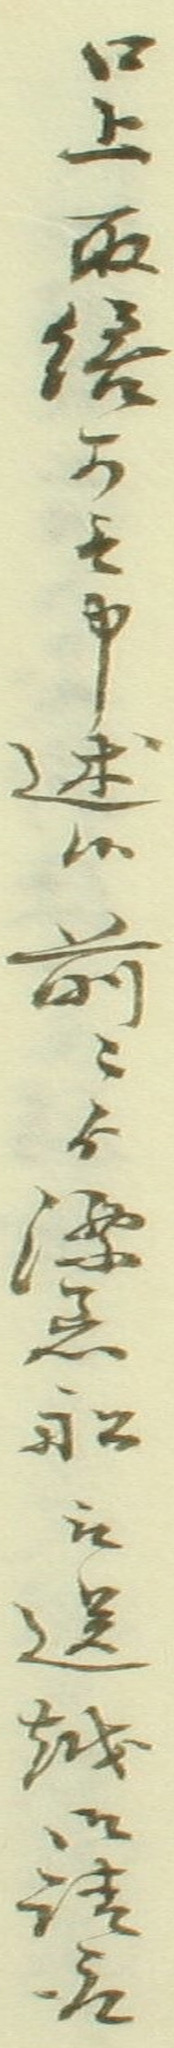口上取繕可被申述候前々ゟ漂着船被送越御請取
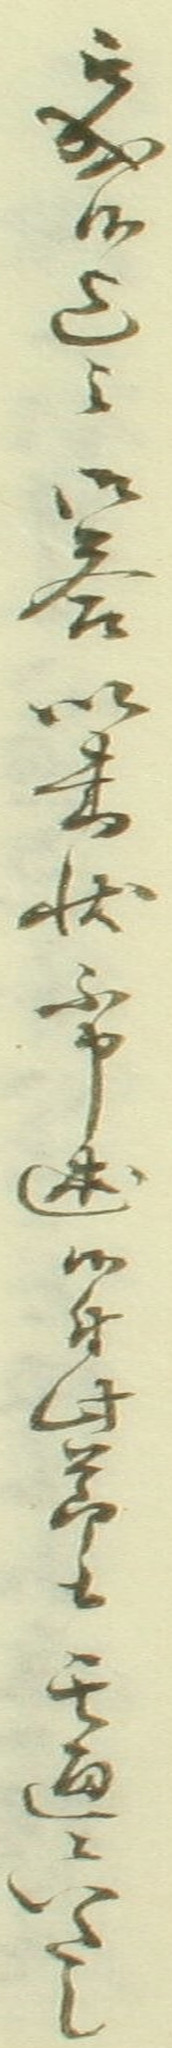被成候迄之御答以書状不申述候付此節も其通にいたし
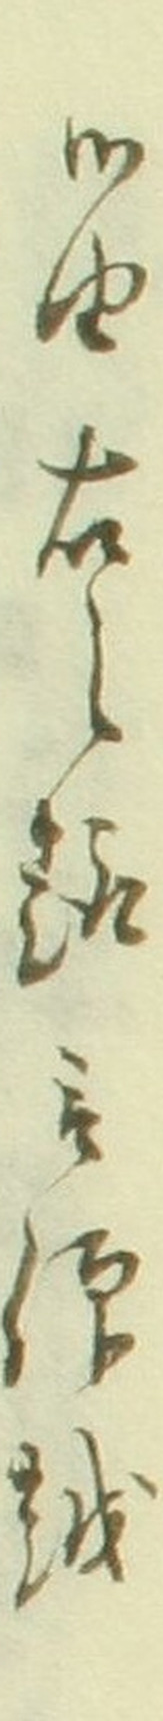候由右之趣被仰越
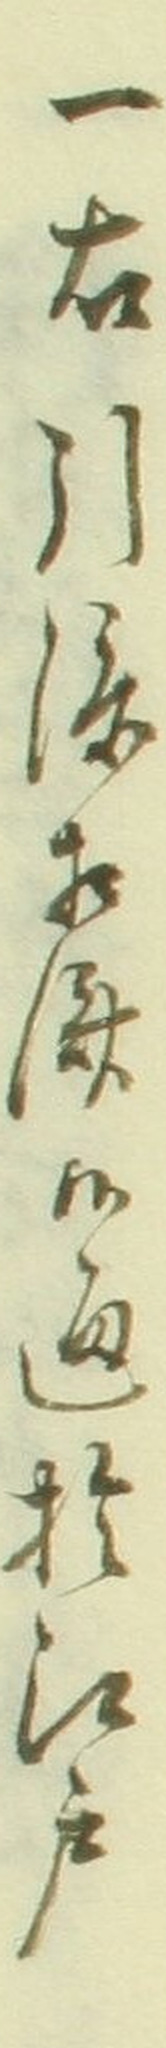一右引渡相済候通於江戸
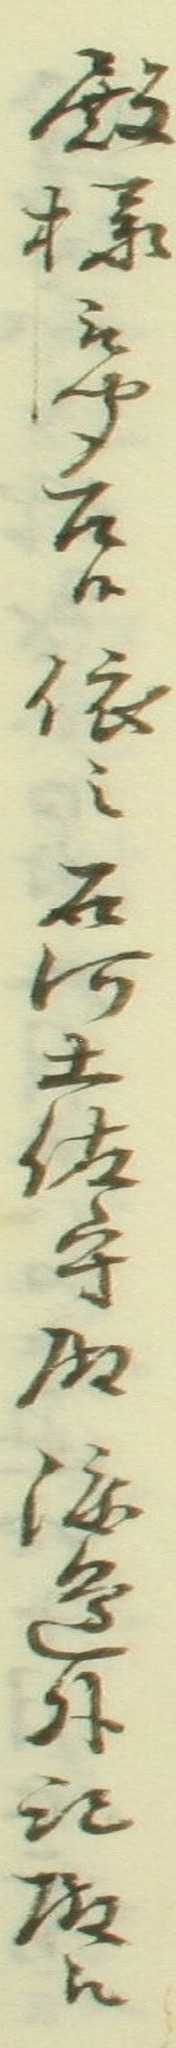殿様被聞召候依之石河土佐守殿渡辺外記殿え
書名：異国船漂着記
